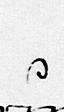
t.
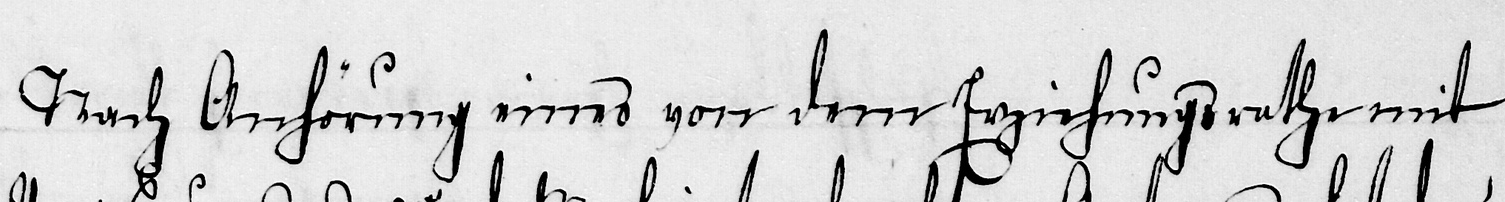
Nach Anhörung eines von dem Erziehungsrathe mit
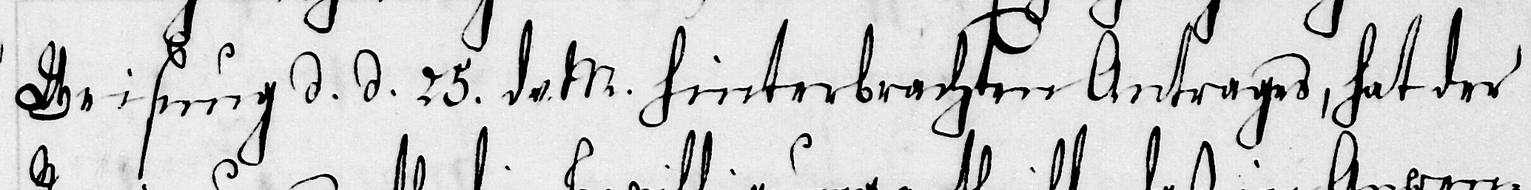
Weisung d. d. 25. d. v. M. hinterbrachten Antrages, hat der
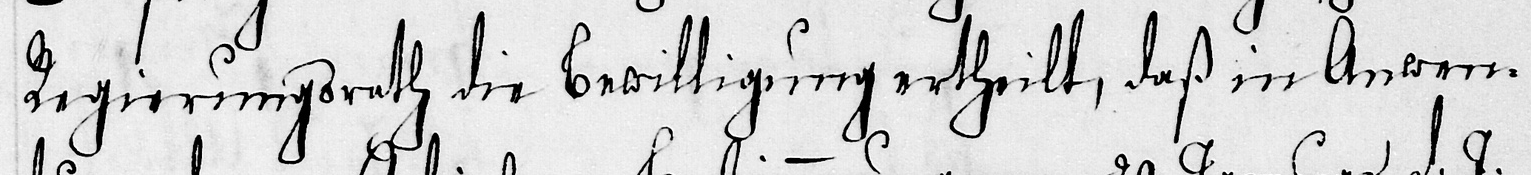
Regierungsrath die Bewilligung ertheilt, daß in Anwen¬
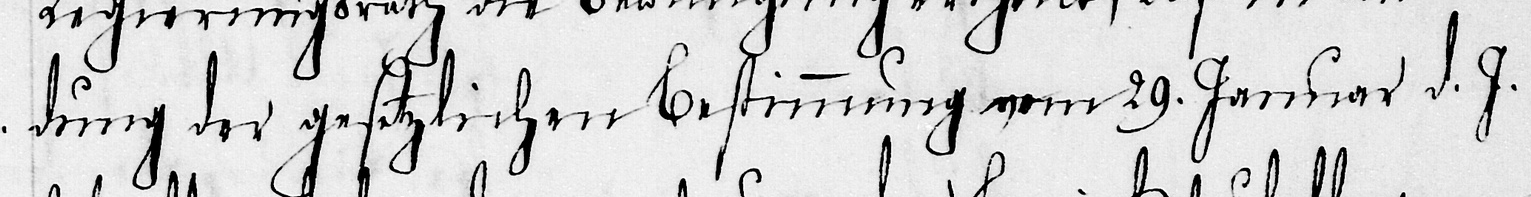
dung der gesetzlichen Bestimmung vom 29. Januar d. J.
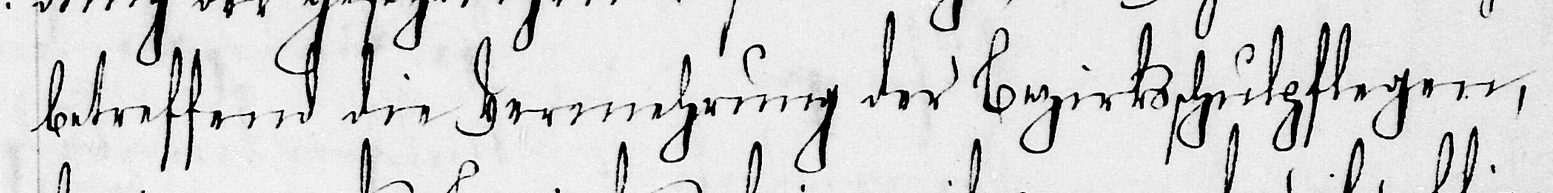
betreffend die Vermehrung der Bezirksschulpflegen,
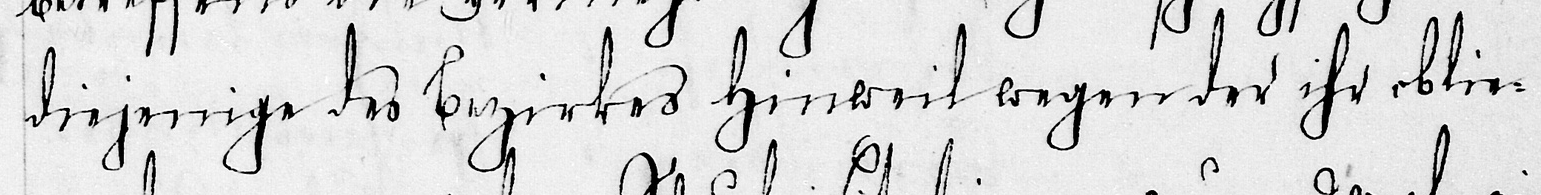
diejenige des Bezirkes Hinweil wegen der ihr oblie¬
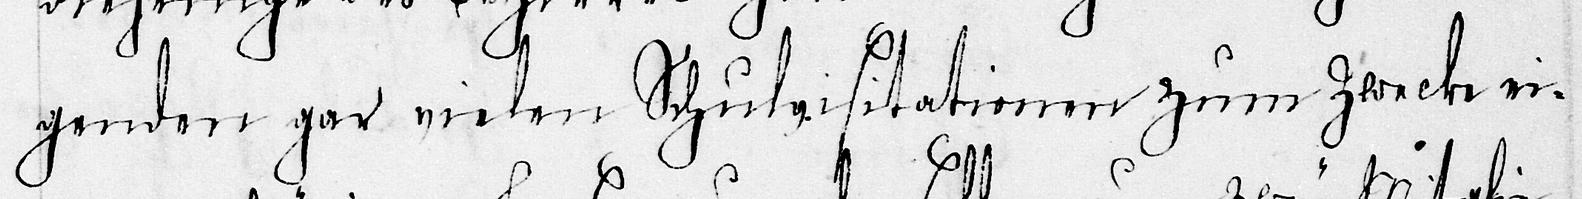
genden gar vielen Schulvisitationen zum Zwecke ei¬
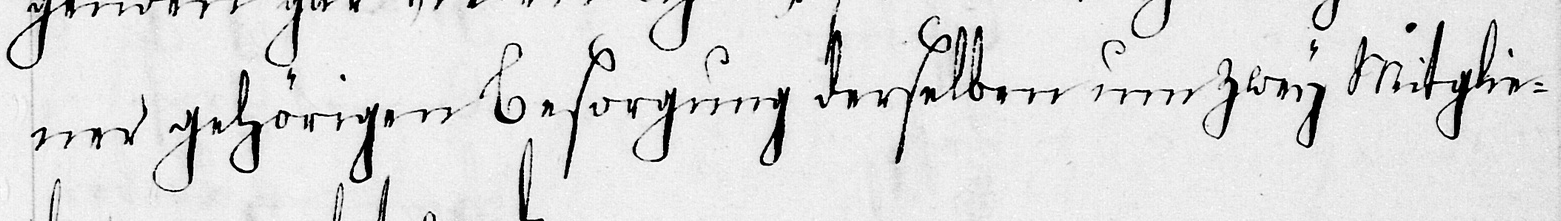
ner gehörigen Besorgung derselben um zwey Mitglie¬
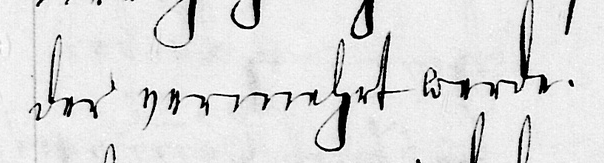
der vermehrt werde.
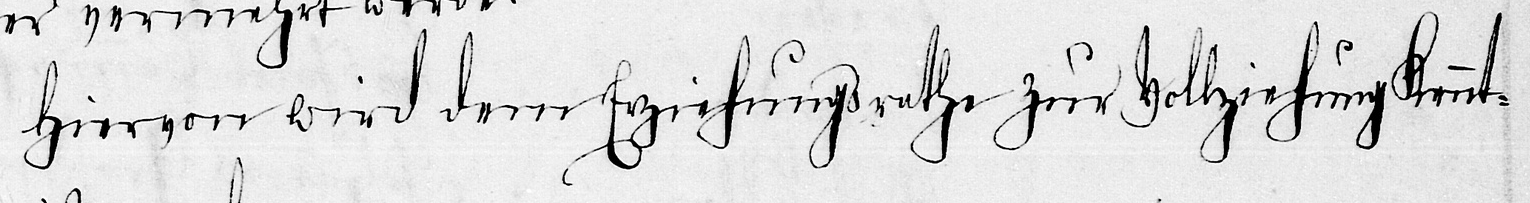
Hiervon wird dem Erziehungsrathe zur Vollziehung Kennt¬
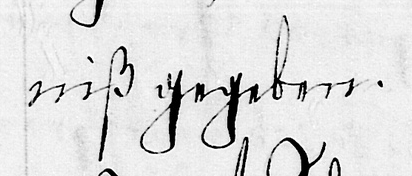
niß gegeben.
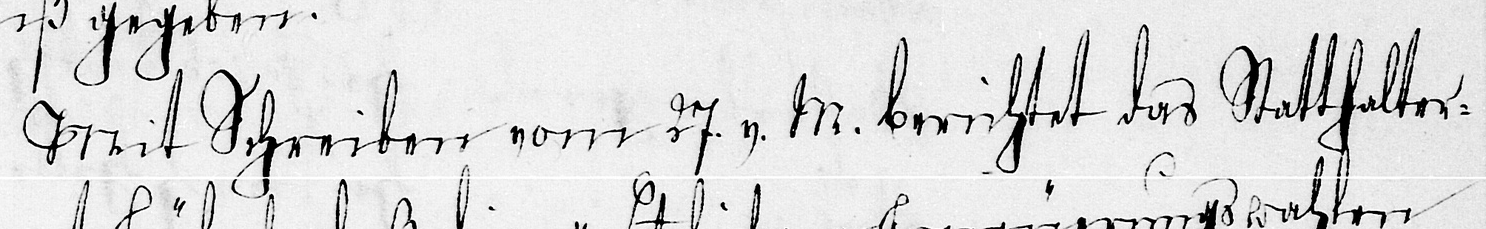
Mit Schreiben vom 27. v. M. berichtet das Statthalte¬
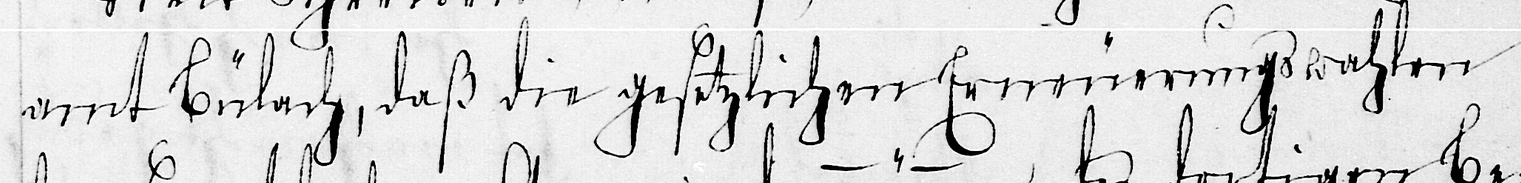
ramt Bülach, daß die gesetzlichen Erneuerungswahlen
